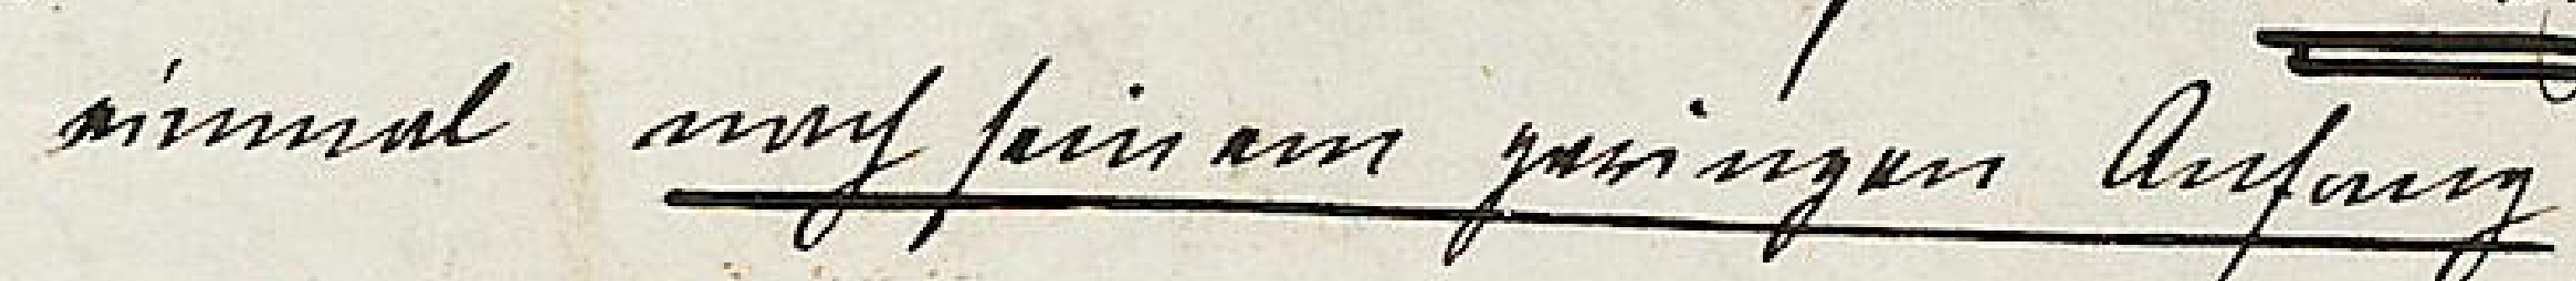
einmal nach seinem geringen Anfang,
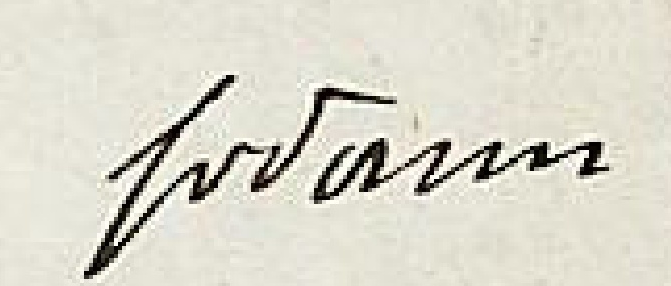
sodann
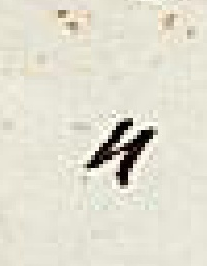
"
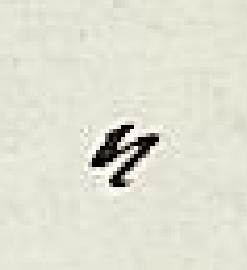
"
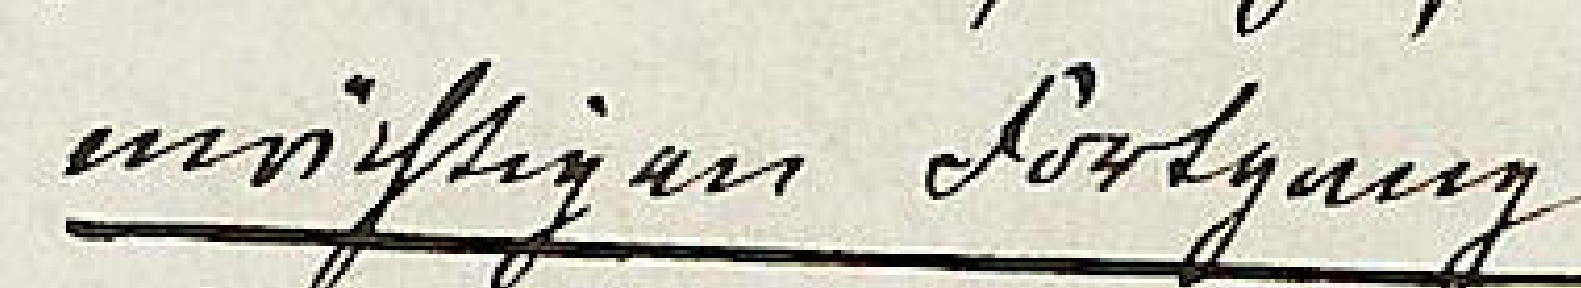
mächtigen Fortgang
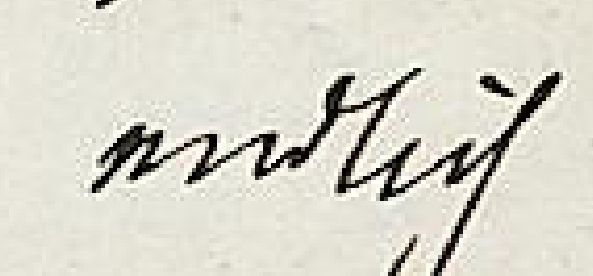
endlich
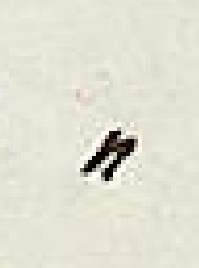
"
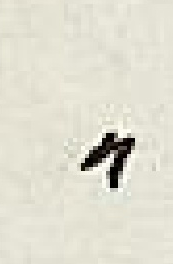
"
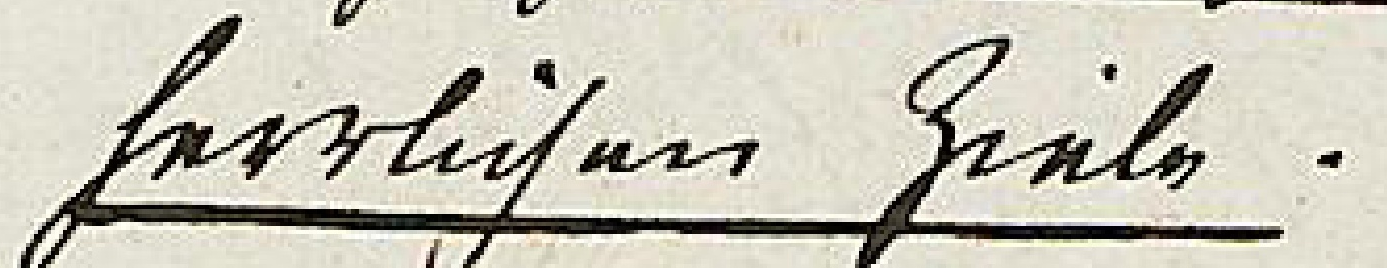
herrlichen Ziele.
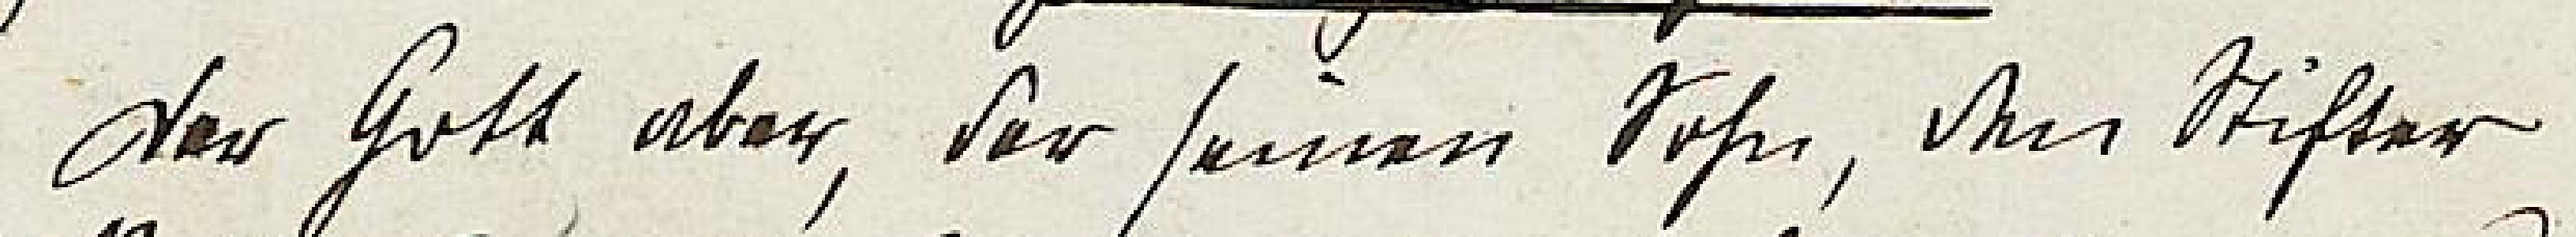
Der Gott aber, der seinen Sohn, den Stifter
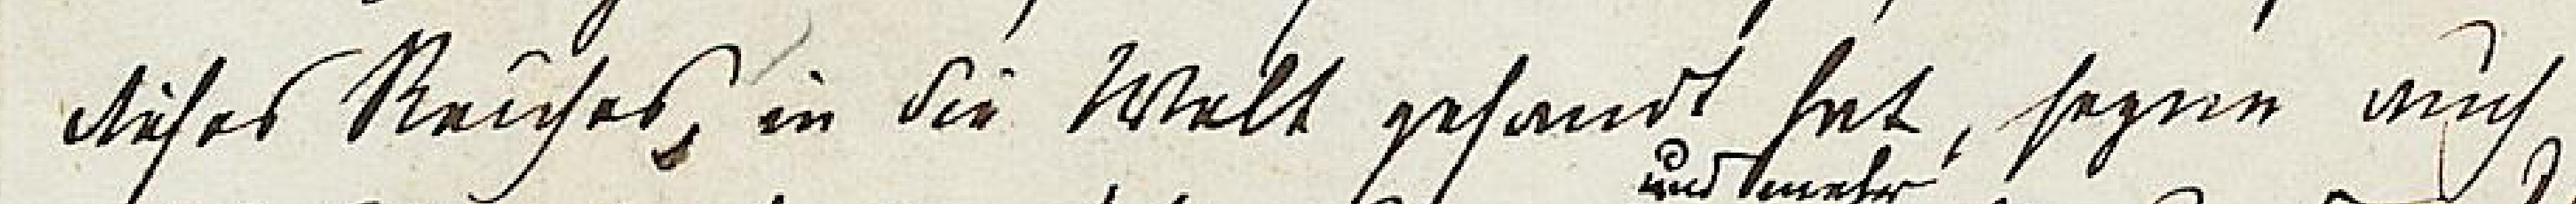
dieses Reiches in die Welt gesandt hat, segne auch
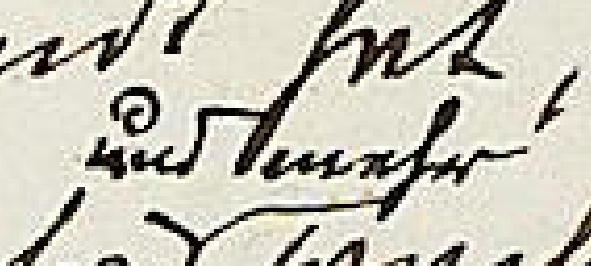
und mehr
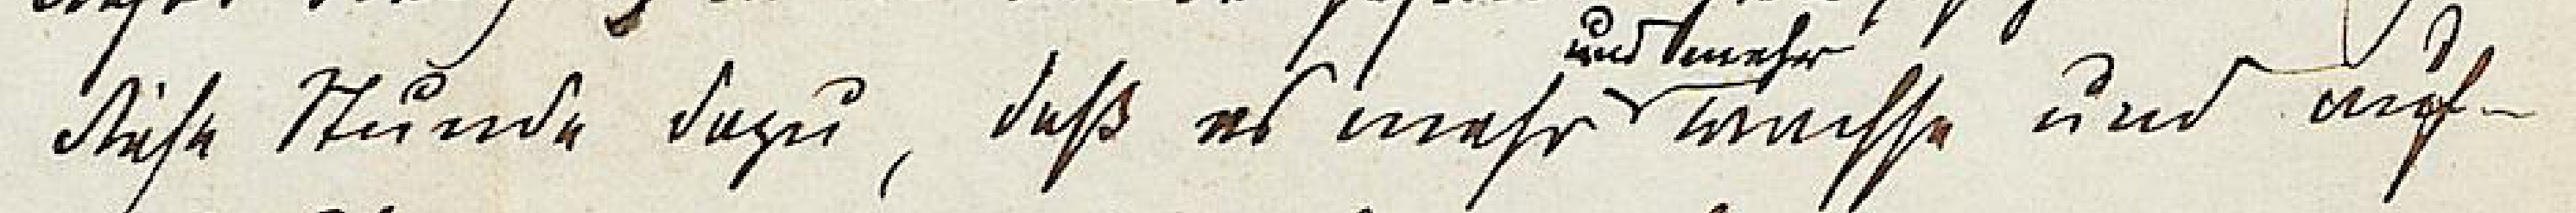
diese Stunde dazu, daß es mehr wachse und auf¬
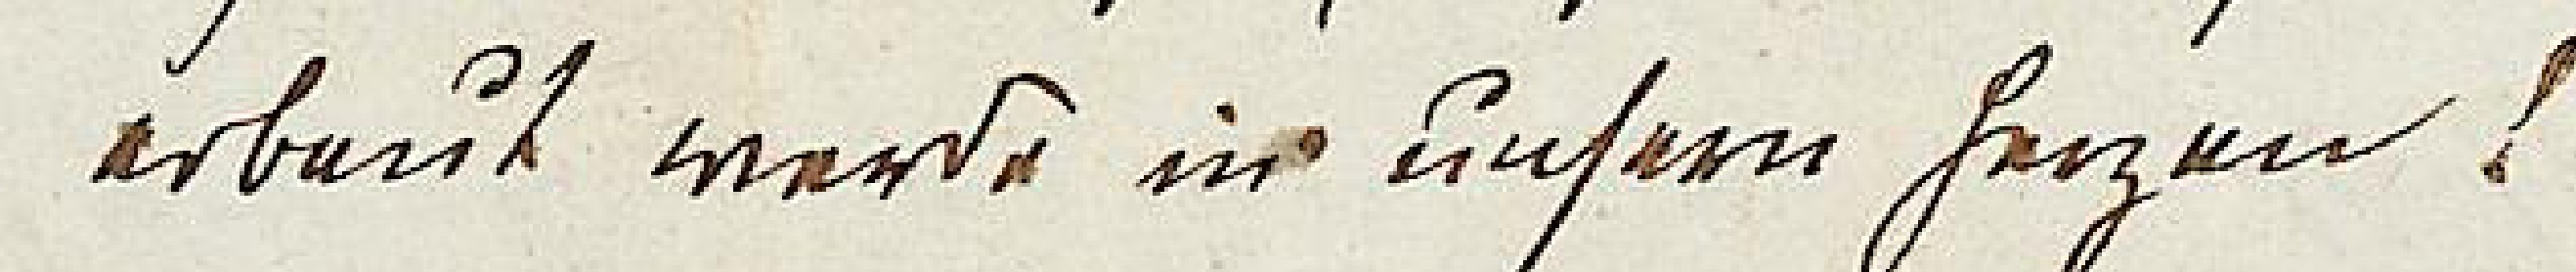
erbaut werd in unsern Herzen!
